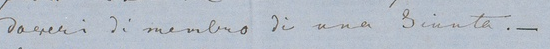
doveri di membro di una Giunta. –
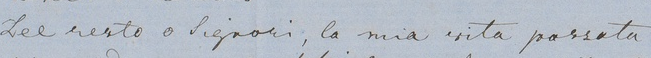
Del resto o Signori, la mia vita passata
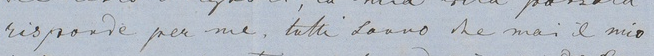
risponde per me, tutti sanno che mai il mio
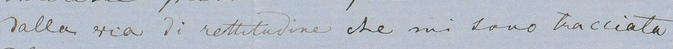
dalla via di rettitudine che mi sono tracciata.
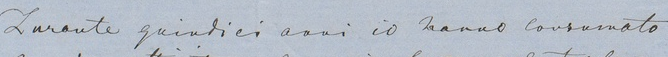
Durante quindici anni io hanno consumato
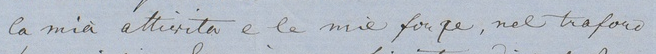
la mia attivita e le mie forze, nel traforo
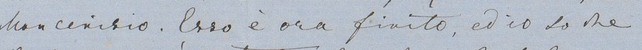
Moncenisio. Esso è ora finito, ed io so che
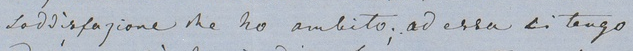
soddisfazione che ho ambito; ad essa si tengo
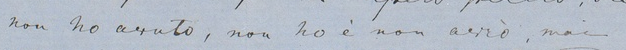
non ho avuto, non ho è non avrò, mai
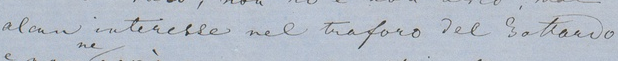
alcun interesse nel traforo del Gottardo
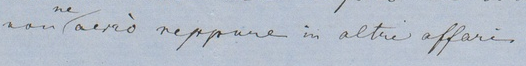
e non ne avrò neppure in altri affari.
